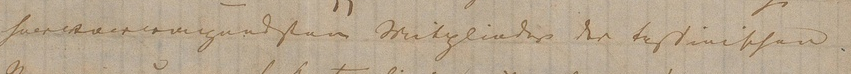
hervorragendsten Mitglieder der tessinischen
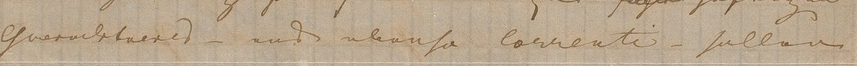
Charakters – und ebenso Correnti – sollen
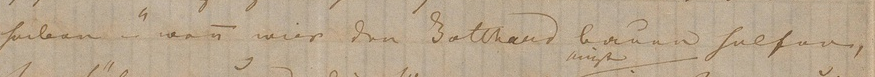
haben – «wenn wir den Gotthard bauen helfen,
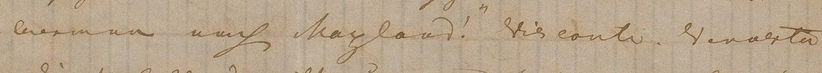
Armee nach Mayland!» Visconti-Venosta
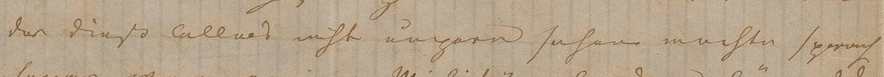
der dieß Alles nicht ungern sehen möchte sprach
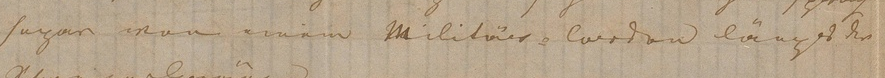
sogar von einem Militär-Cordon längs der
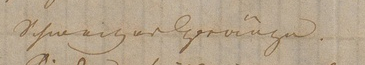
SchweizerGränze.
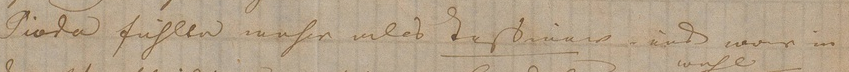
Pioda fühlte mehr als Tessiner – und war in
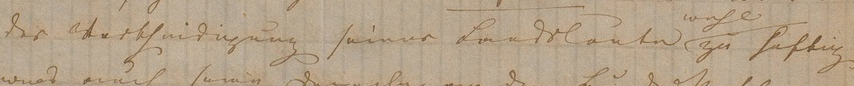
der Vertheidigung seiner Landsleute wohl zu heftig
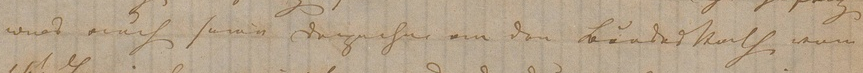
was auch seine Depeche an den BundesRath vom
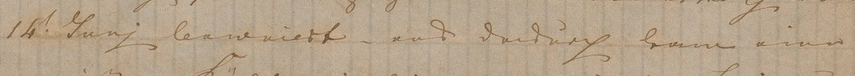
14t Junj beweist – und dadurch kam eine
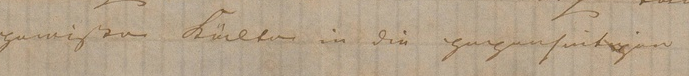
gewiße Kälte in die gegenseitigen
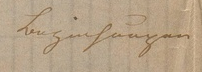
Beziehungen.
